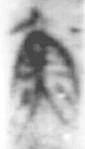魚
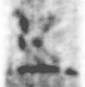之
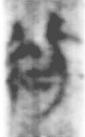紫
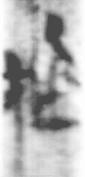○（錦）
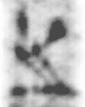之
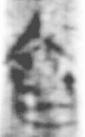裏
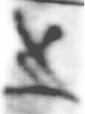之
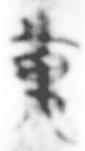黃
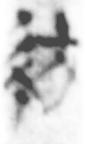紡
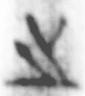之
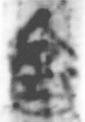裏
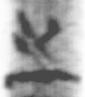之
